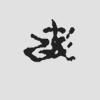萅
